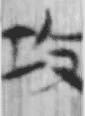攻
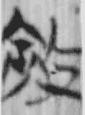叙
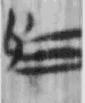於
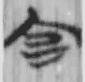宮
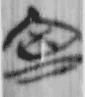室
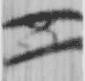五
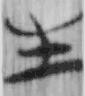生
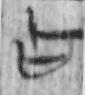占
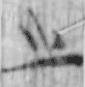之
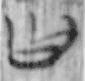曰
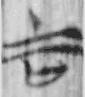吉
